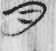月
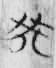癸
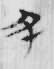丑
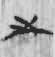之
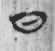日
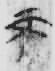不
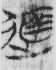𬨭（將）
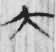大
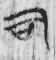司
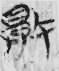敗
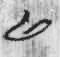㠯（以）
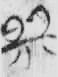○（盟）
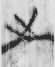之
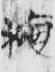○（被）
